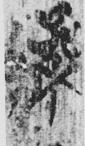劋
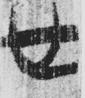也
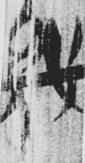幾（豈）
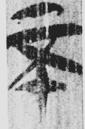不
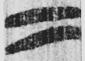二
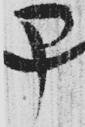子
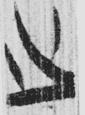之
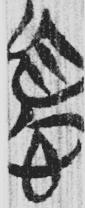○（憂）
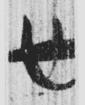也
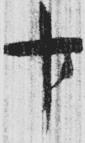才（哉）
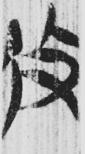伋（隰）
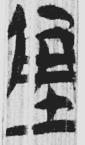○（朋）
